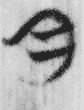月
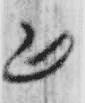㠯（以）
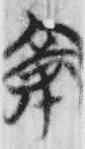○（就）
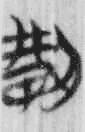○（荆）
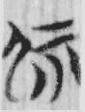𫵖
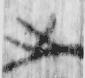之
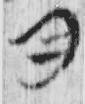月
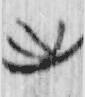出
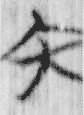內（入）
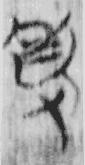事
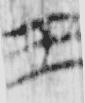王
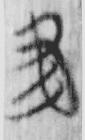○（盡）
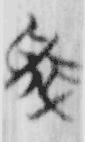○（卒）
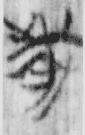歲（歲）
